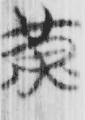黃
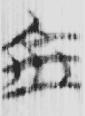金
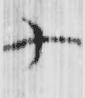七
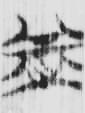益
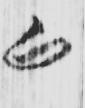㠯（以）
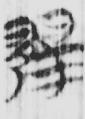翟（糴）
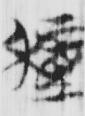穜（種）
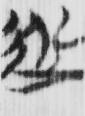迄
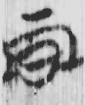○（期）
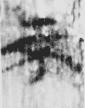不
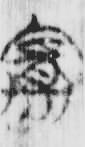賽
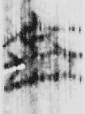金
